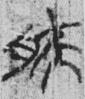肤（膚）
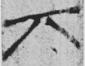亓（其）
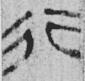行
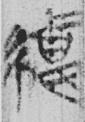緀（萋）
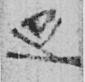疋（且）
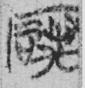礪
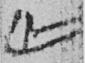亡
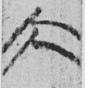六
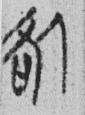咎
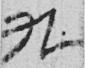九
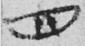四
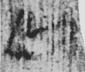亡（无）
